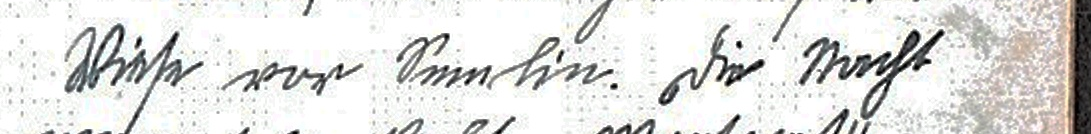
Wiese vor Semlin. Die Nacht
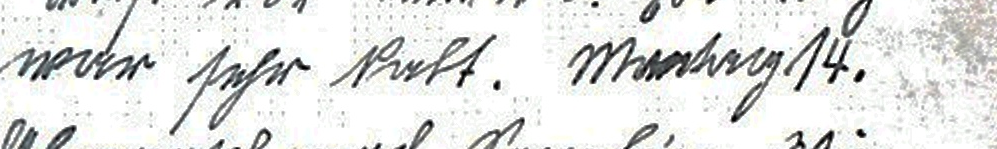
war sehr kalt. Montag 14.
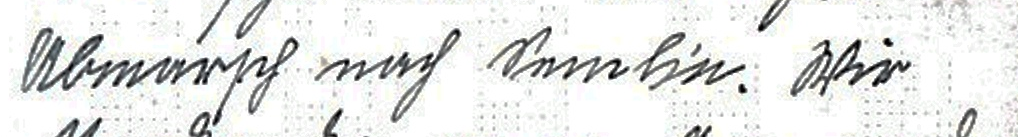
Abmarsch nach Semlin. Wir
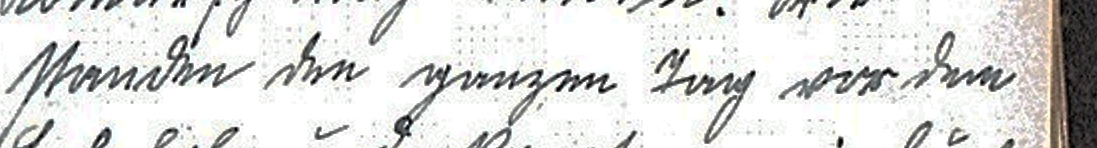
standen den ganzen Tag vor dem
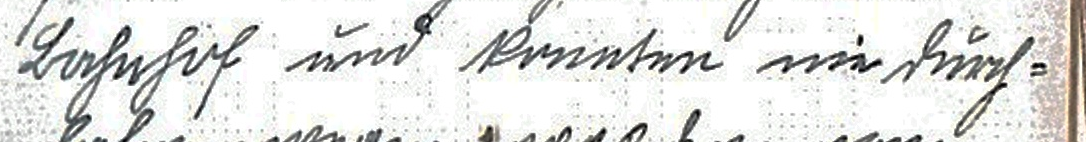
Bahnhof und konnten nie durch-
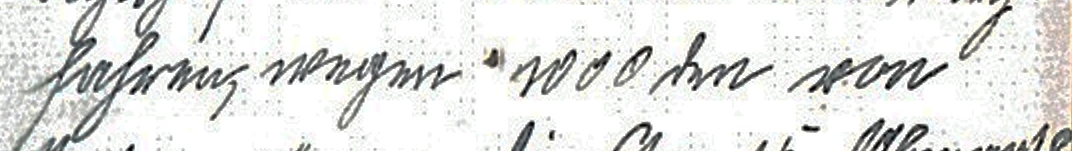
fahren, wegen 1000en von
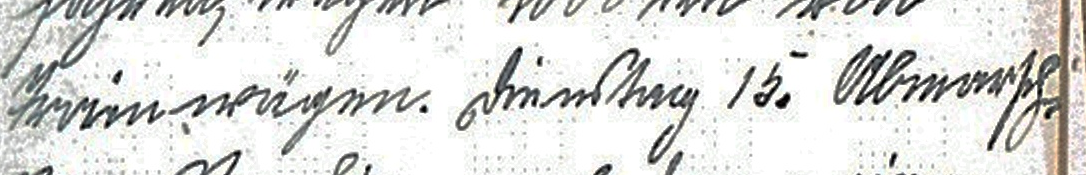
Trainwägen. Dienstag 15. Abmarsch
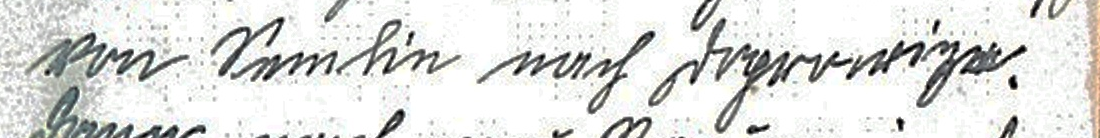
von Semlin nach Irgorwitz.
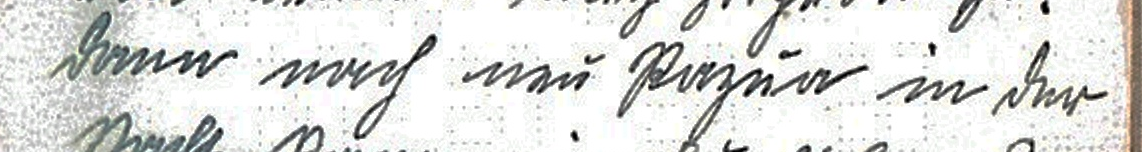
Dann nach xx Pazeia in der
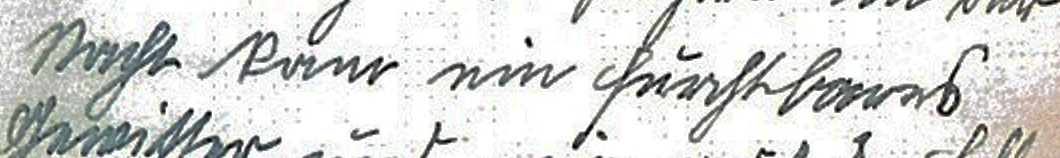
Nacht kam ein furchtbares
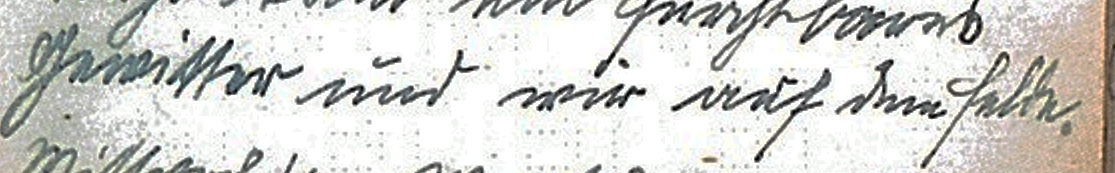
Gewitter und wir auf dem Felde
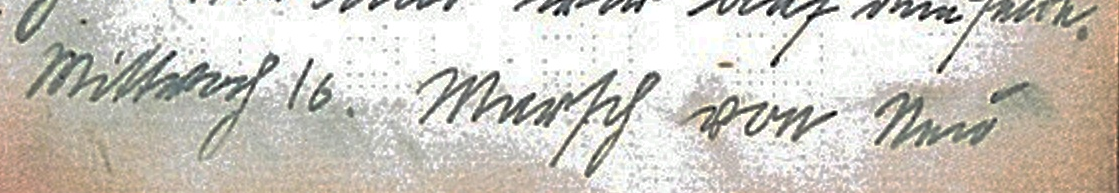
Mittwoch 16. Marsch von Nähe
